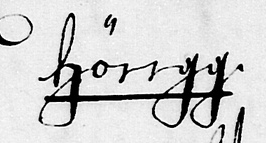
Höngg.
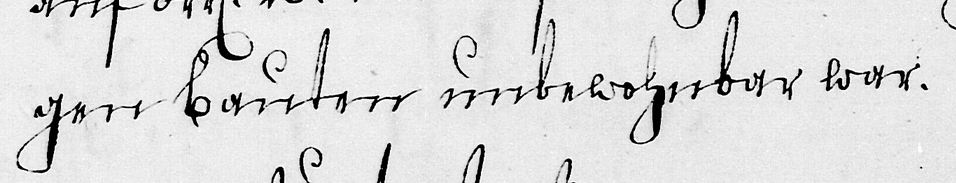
gen Bauten unbewohnbar war.
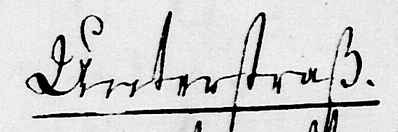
Unterstraß.
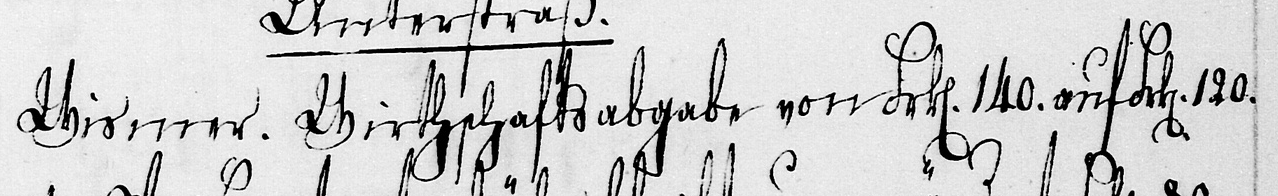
Wismer. Wirthschaftsabgabe von Frk[en]. 140.
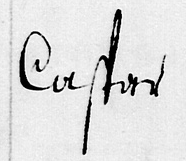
Caspar
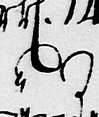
60.
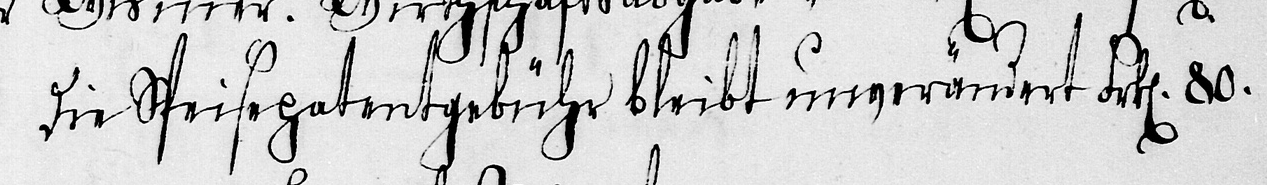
Die Speisepatentgebühr bleibt unverändert Frk[en].
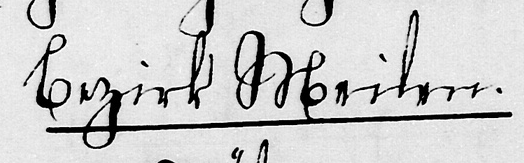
Bezirk Meilen.
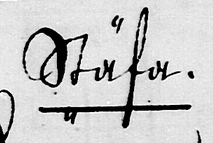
Stäfa.
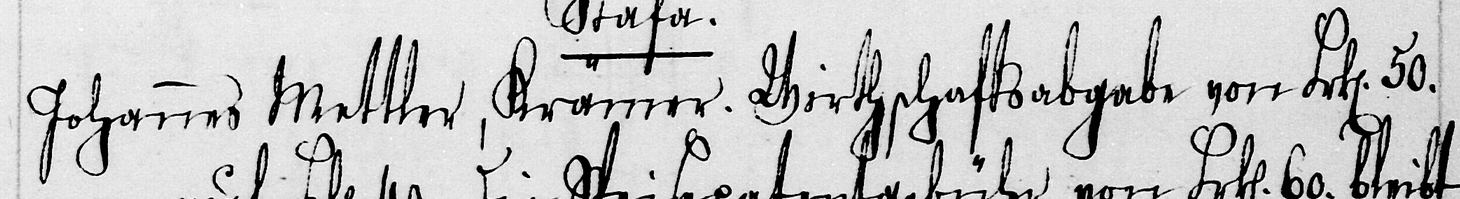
Johannes Mettler, Krämer. Wirthschaftsabgabe von Frk[en].
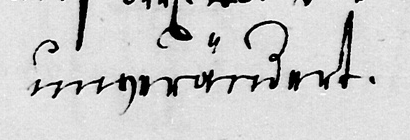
unverändert.
